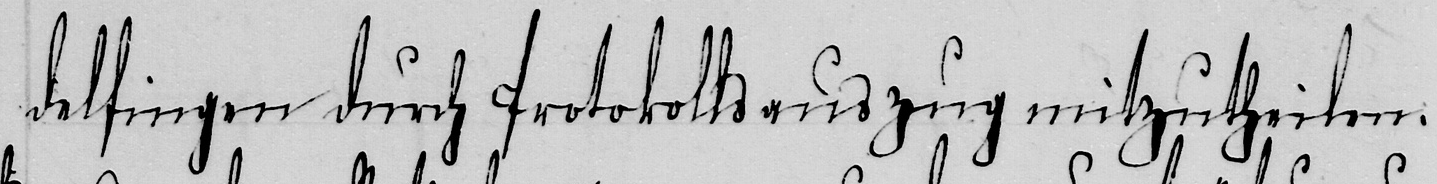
delfingen durch Protokollsauszug mitzutheilen.
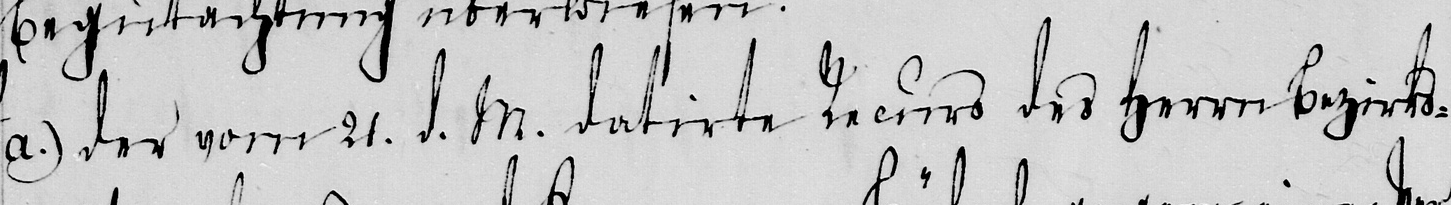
a.) der vom 21. d. M. datirte Recurs des Herrn Bezirks¬
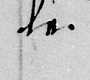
des
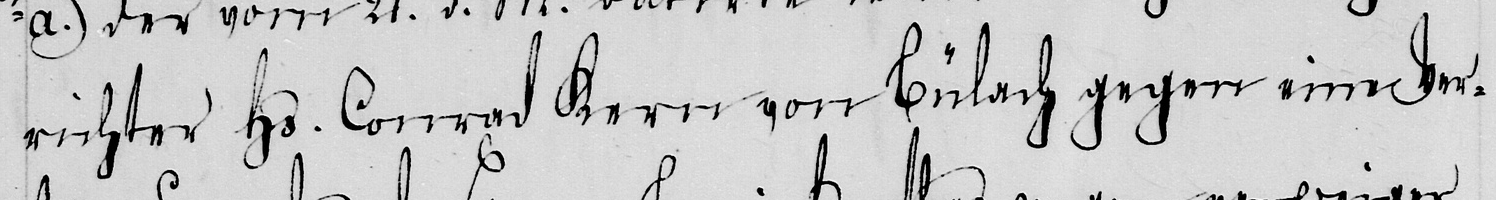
richter Hs. Conrad Kern von Bülach gegen eine Ver¬
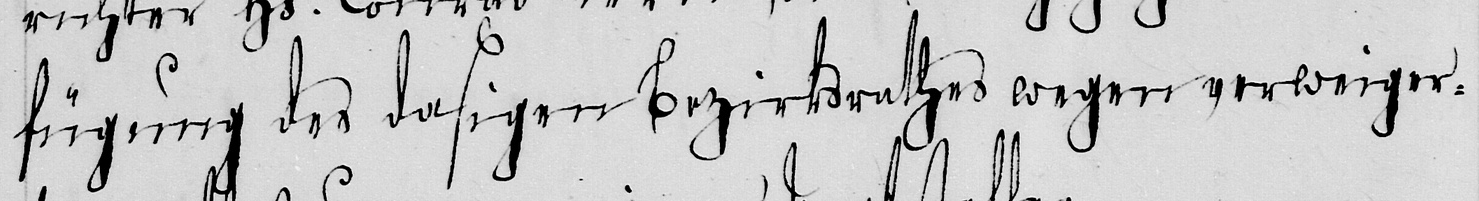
fügung des dasigen Bezirksrathes wegen verweiger¬
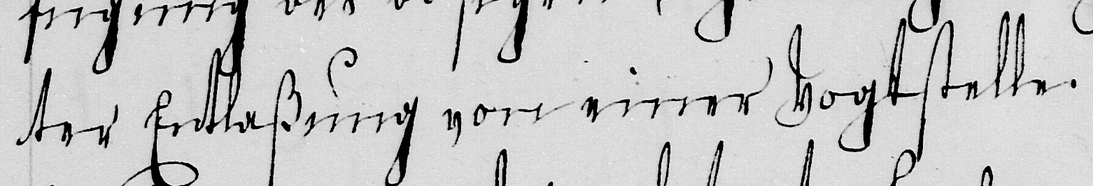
ter Entlaßung von einer Vogtstelle.
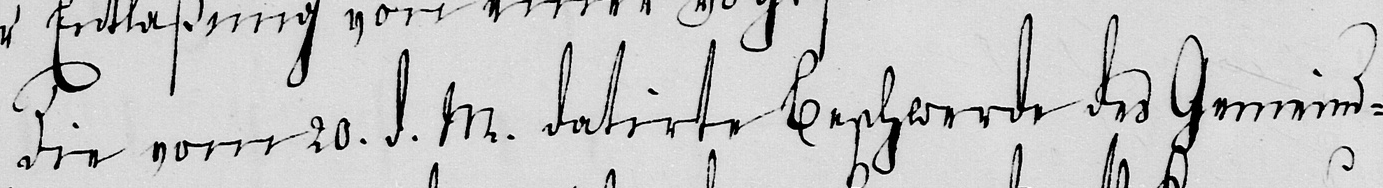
die vom 20. d. M. datirte Beschwerde des Gemeind¬
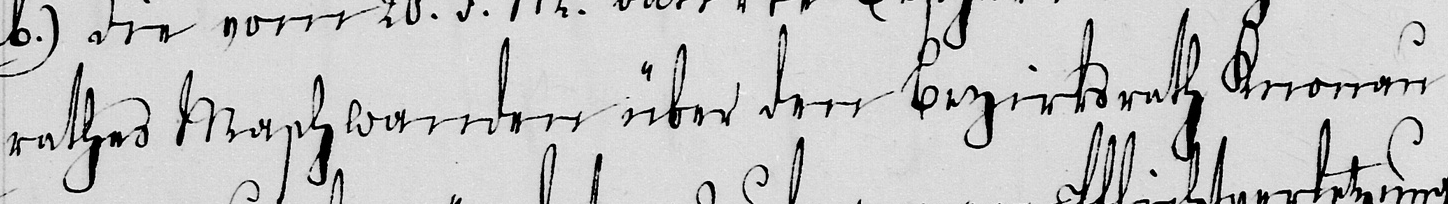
rathes Maschwanden über den Bezirksrath Knonau
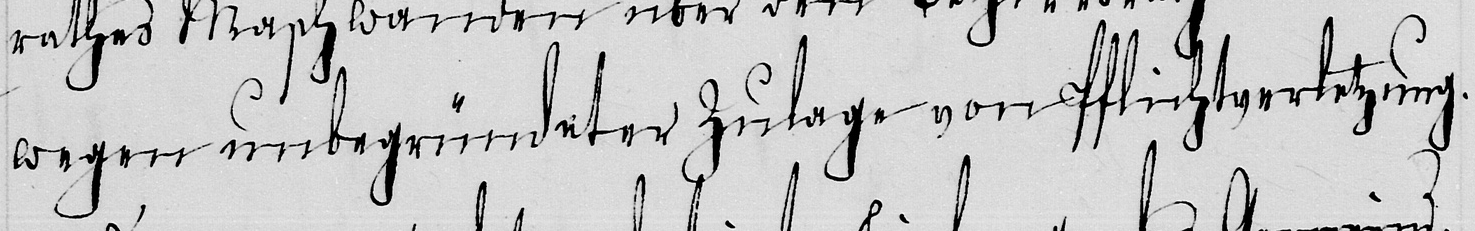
wegen unbegründeter Zulage von Pflichtverletzung.
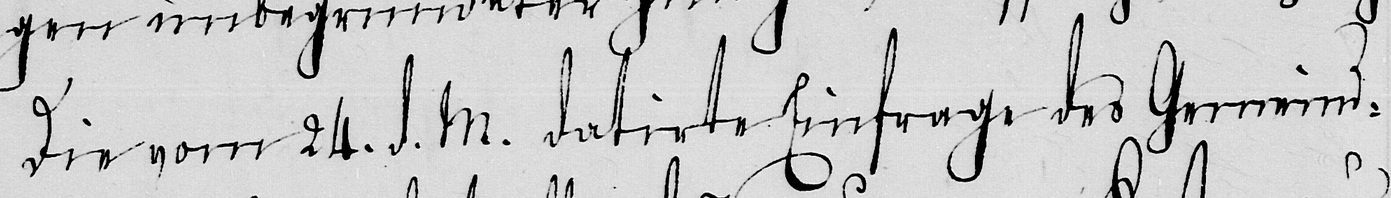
Die vom 24. d. M. datirte Einfrage des Gemeind¬
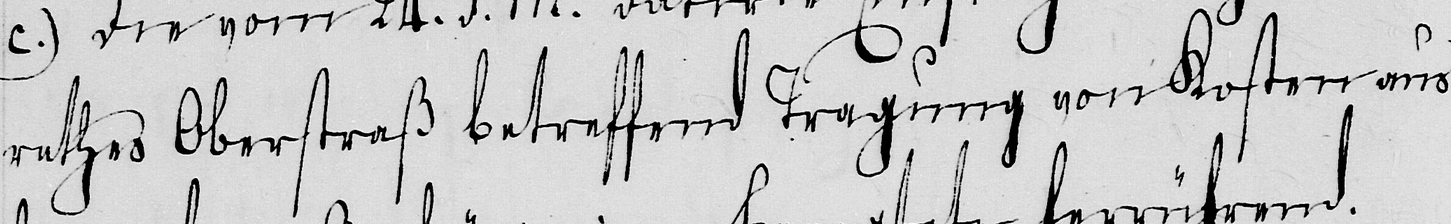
rathes Oberstraß betreffend Tragung von Kosten aus
